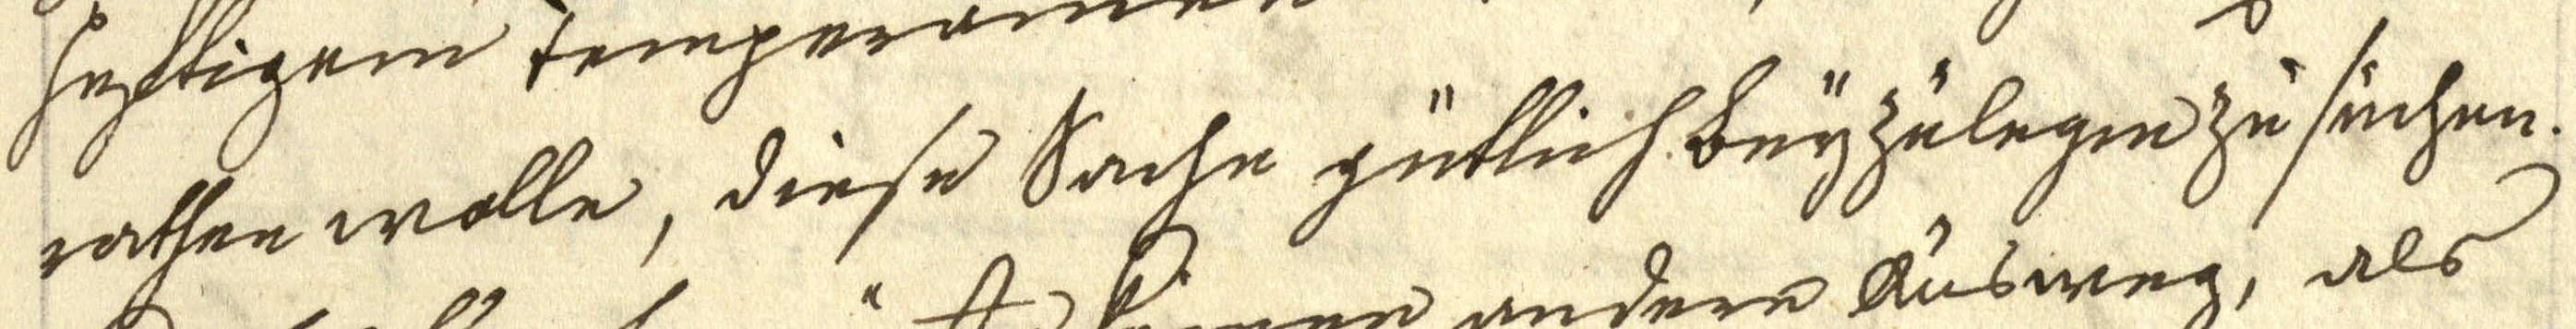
rathen wolle, diese Sache gütlich beÿzulegen zu suchen.
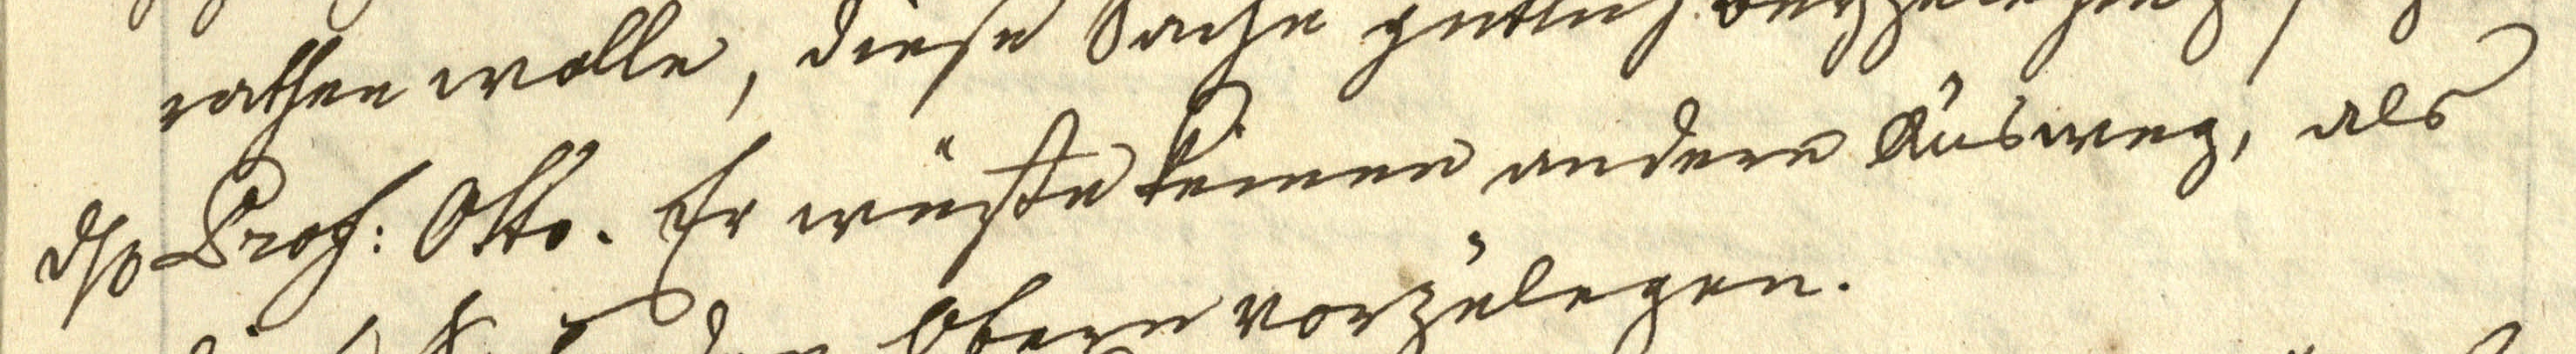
dh Prof. Otto. Er wüste keinen andern Ausweg, als
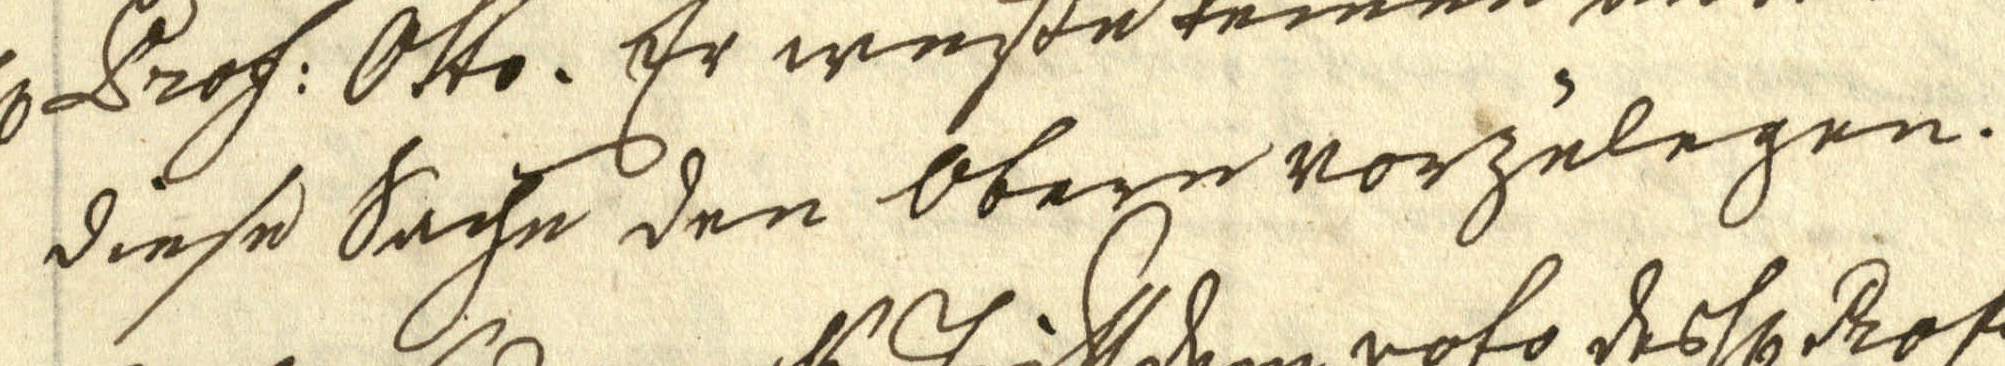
diese Sache den Obern vorzulegen.
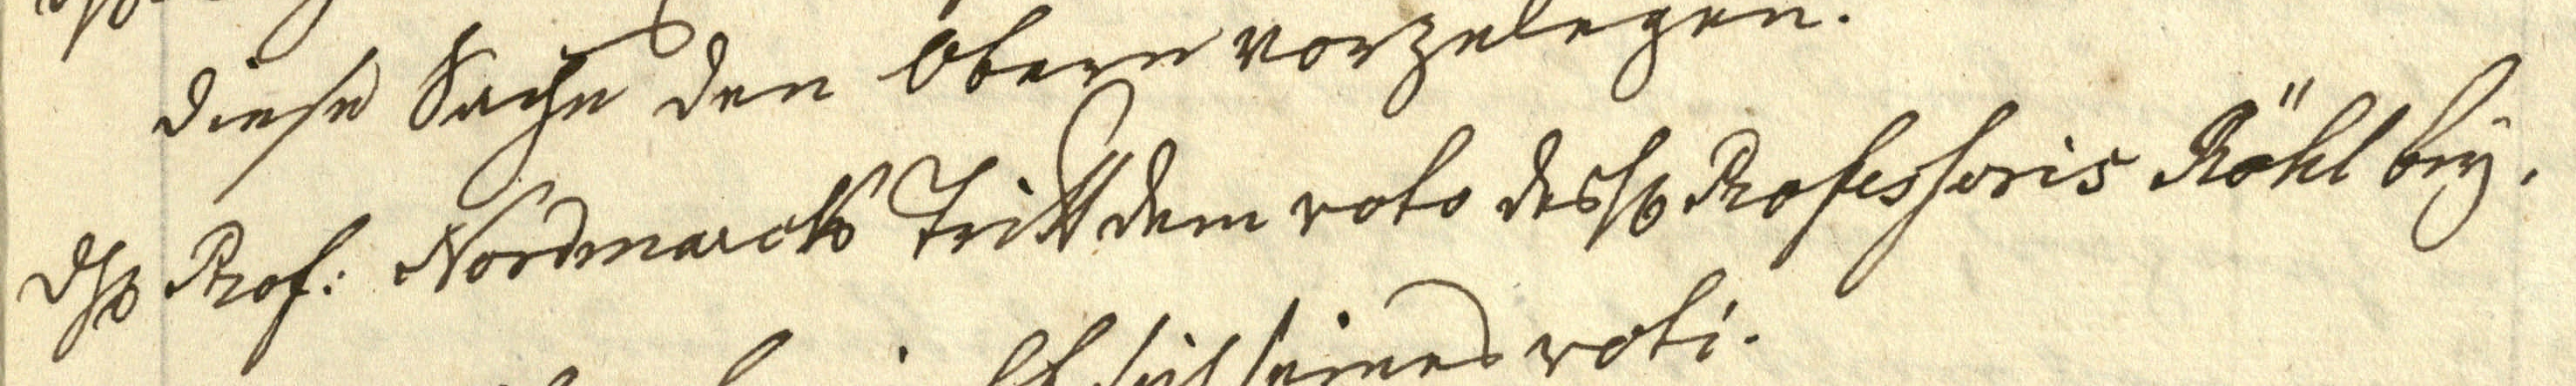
dh Prof. Nordmarck Tritt dem voto des h Professoris Röhl beÿ.
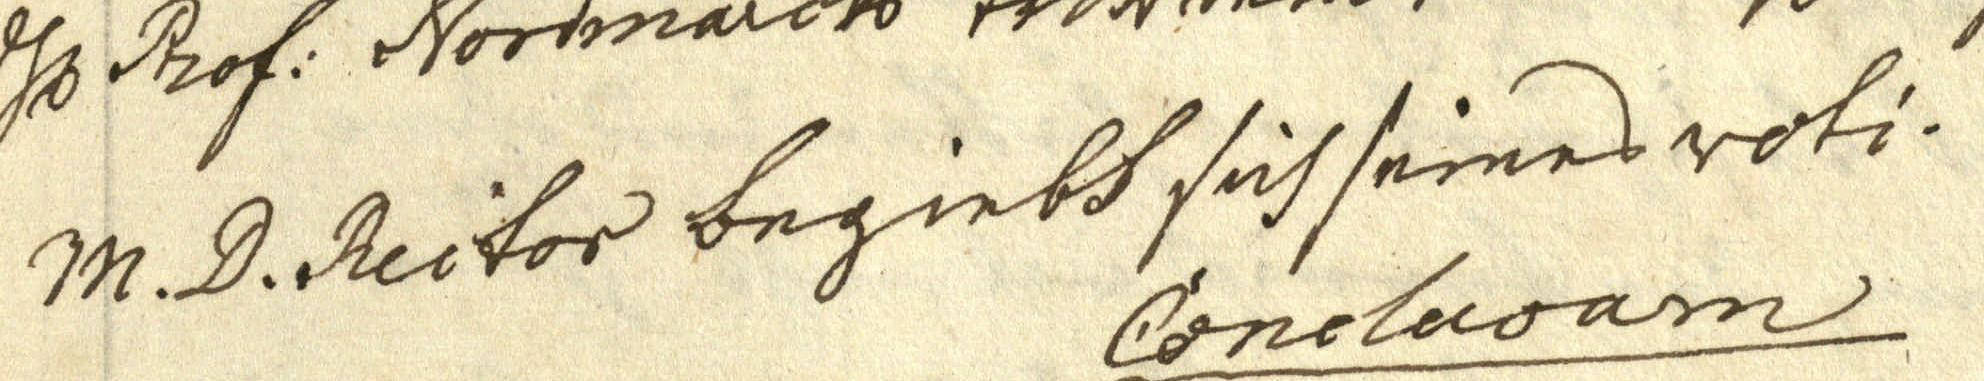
M. D. Rector begiebt sich seines voti.
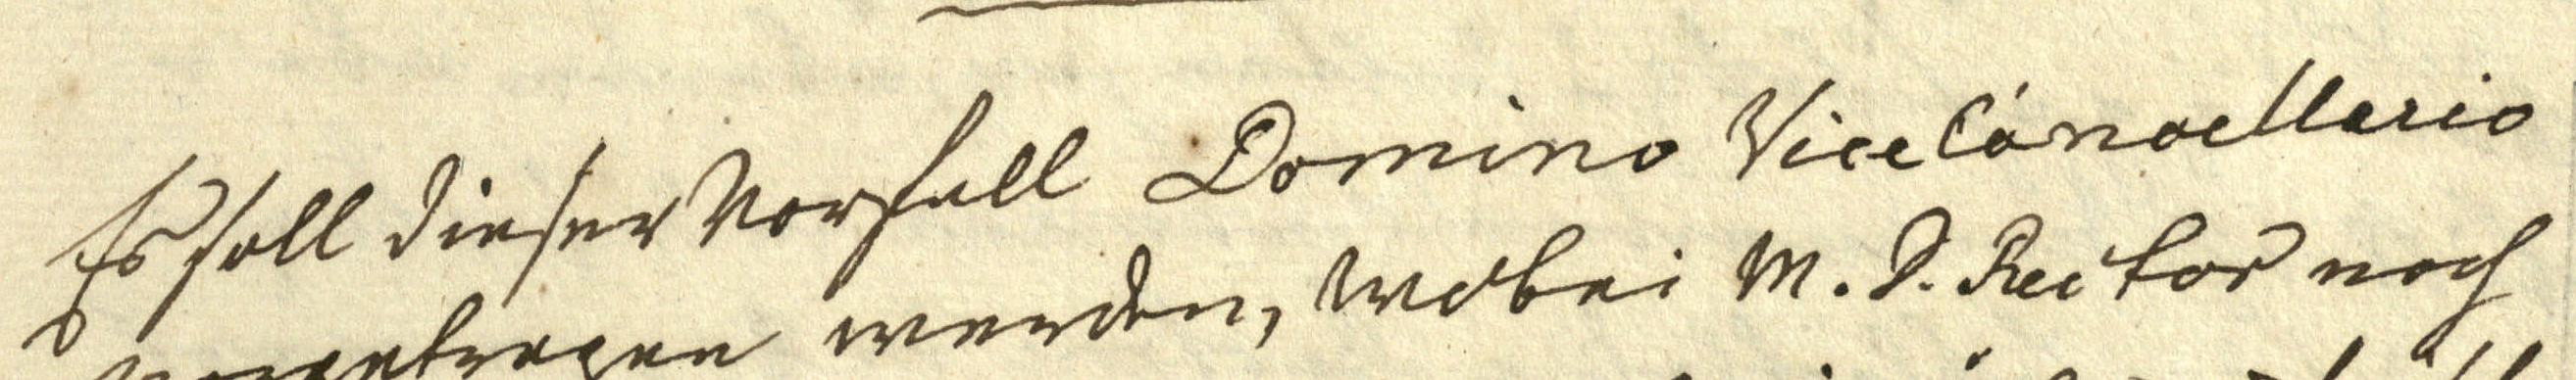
Es soll dieser Vorfall Domino ViceCancellario
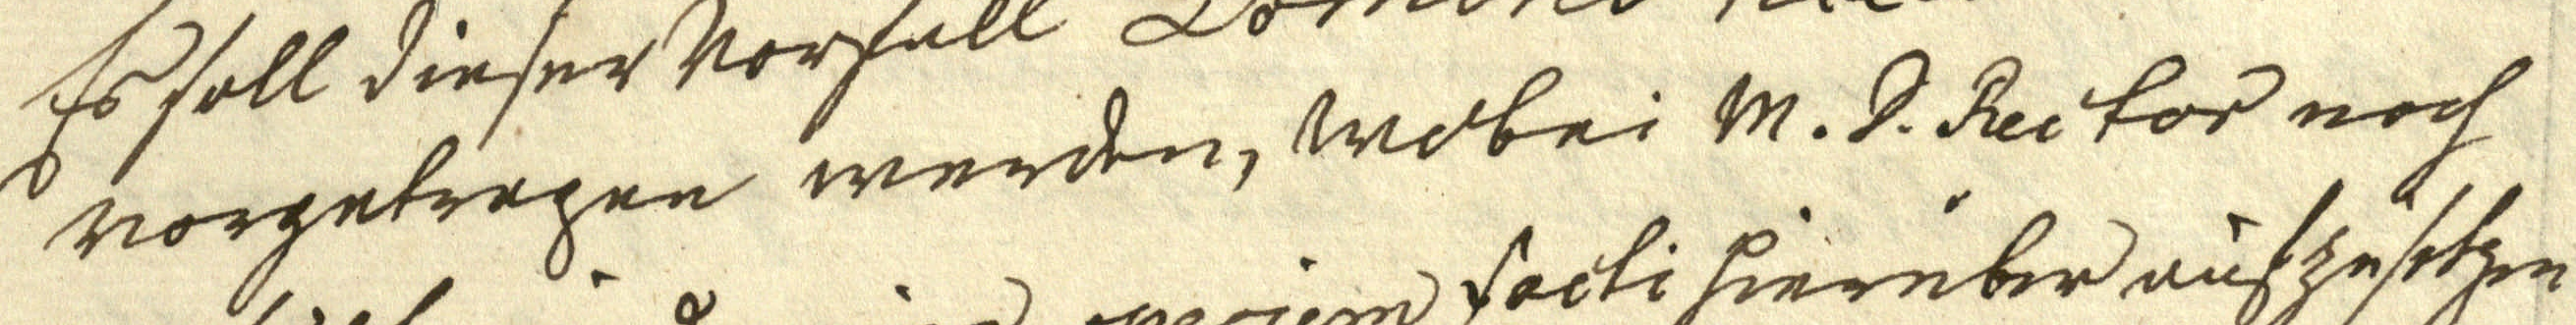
vorgetragen werden, wobei M. D. Rector noch
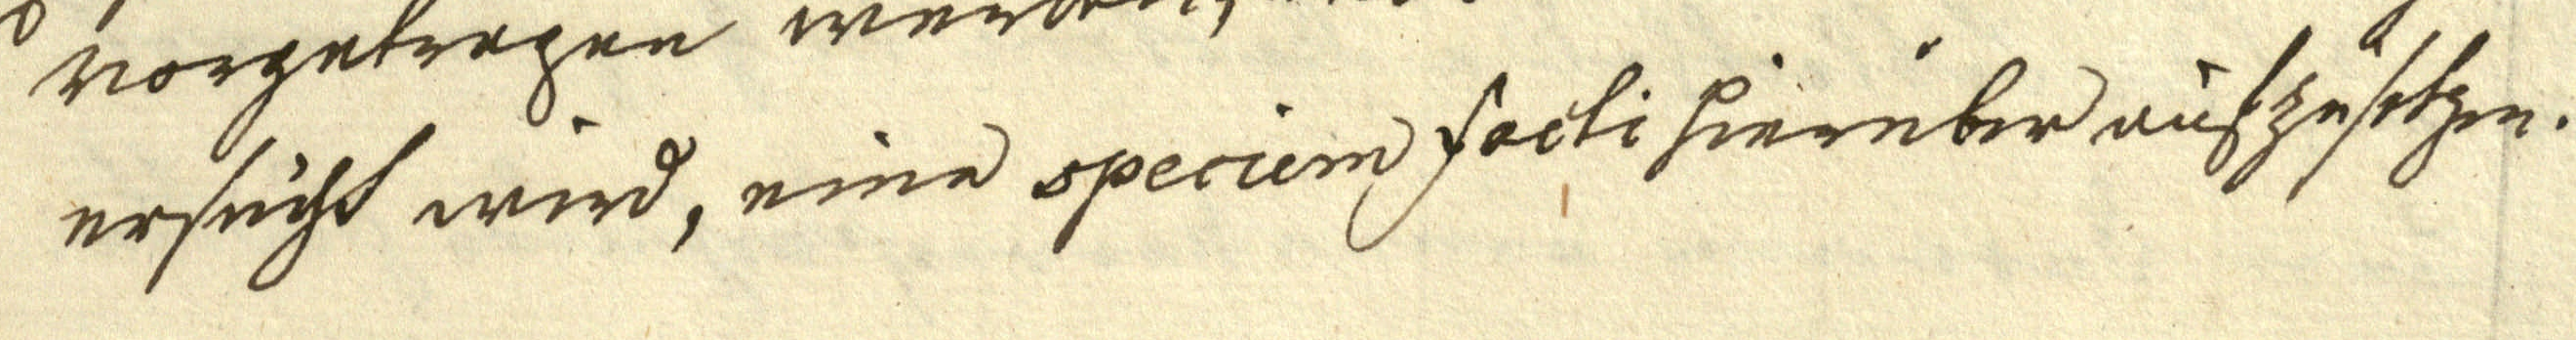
ersucht wird, eine speciem Facti hierüber aufzusetzen
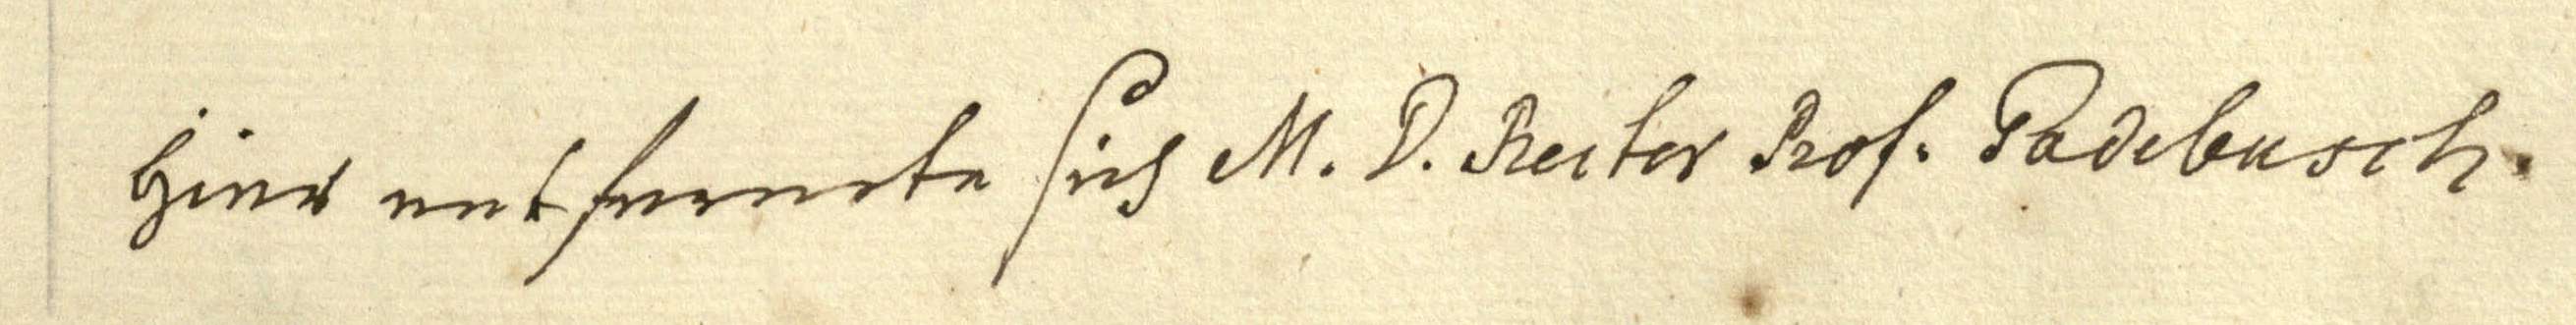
Hier entfernte sich M. D. Rector Prof. Gadebusch.
